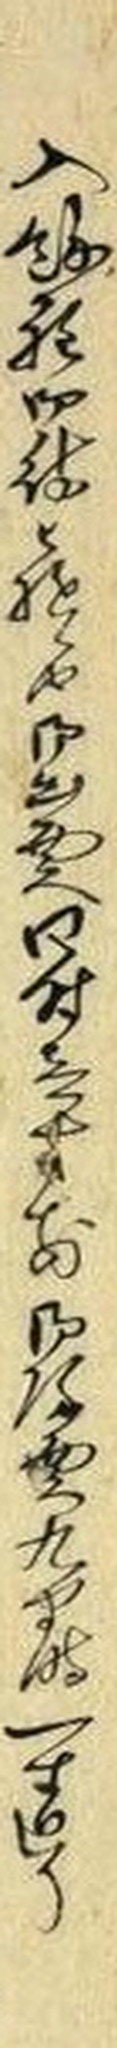入餘程御待被遊候由御出殿四時壱寸前御帰殿九半時一寸廻り
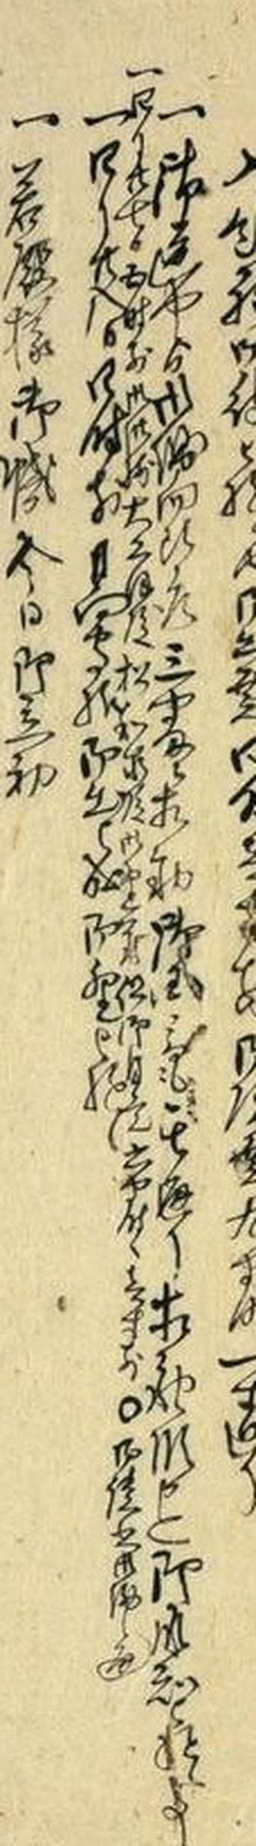一四月廿八日四時前日向守様御出被成御逢被遊候
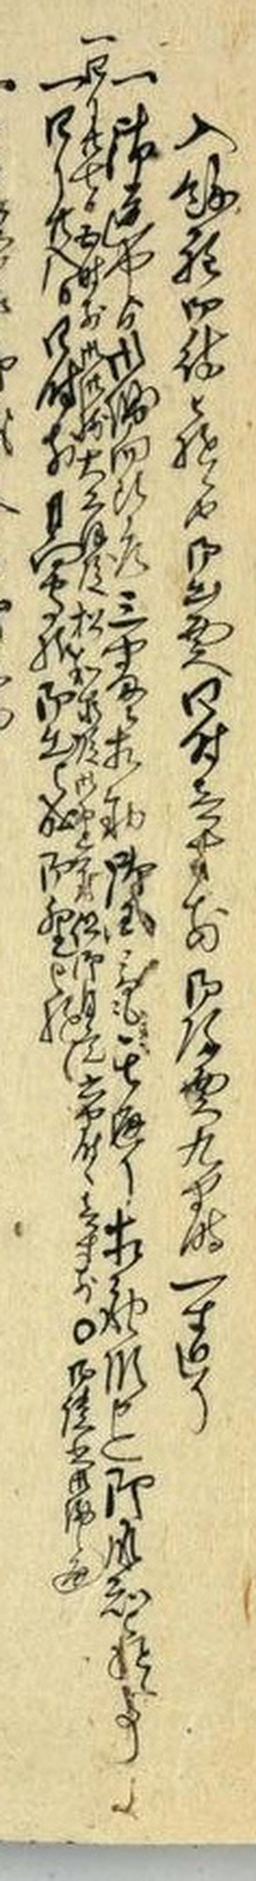一御道中ゟ御側向頭取三番ニ相勤御国ニ而も其通り相勤候段申上御承知被遊候事
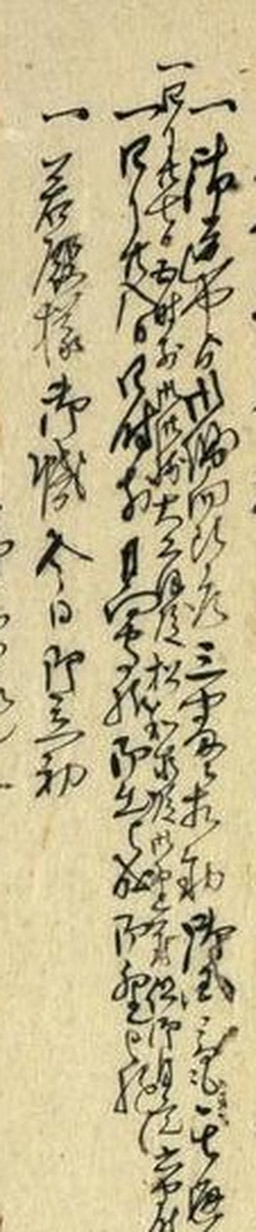一四月廿八日四時前日向守様御出被成御逢被遊候
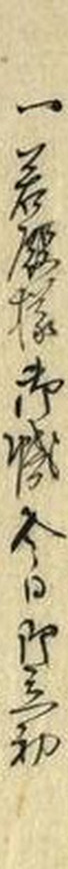一若殿様御幟今日御立初
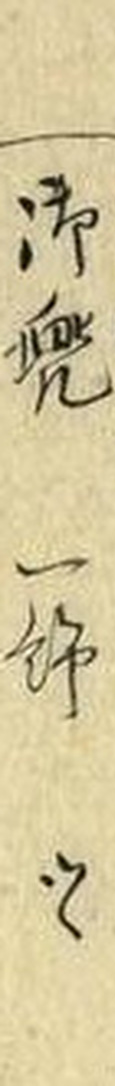御兜一飾りツゝ
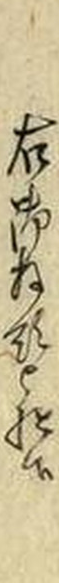右御拝領被遊候
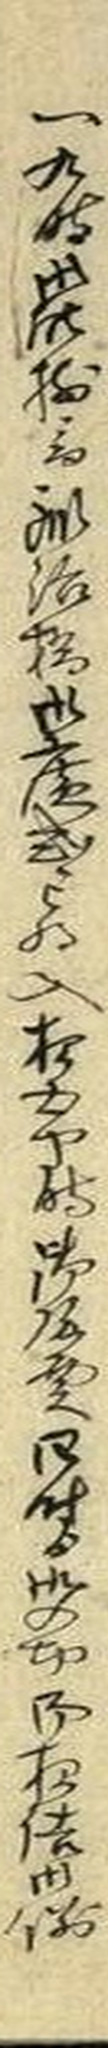一九時御供揃ニ而鍛冶橋御広式へ被為入夜五半時御帰殿四時ゟ御〆切御夜詰御例
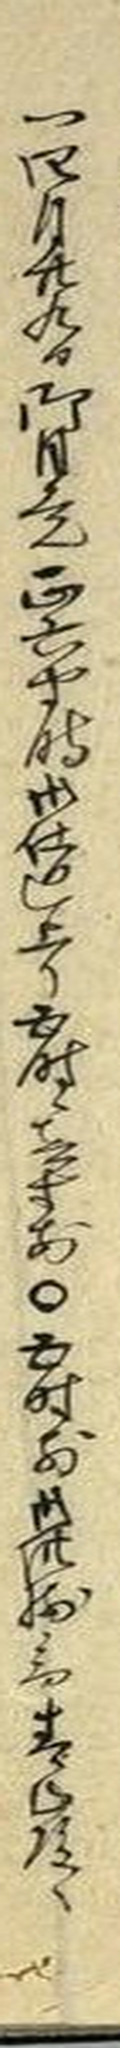一四月廿九日御目覚正六半時御仕廻上り五時へ壱寸前○五時前御供揃ニ而青山殿へ
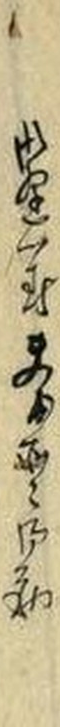御逢対夫ゟ所々御勤
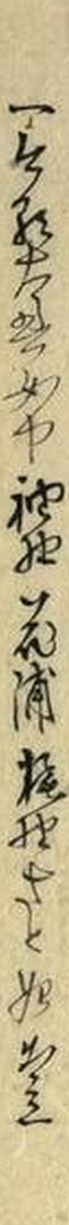一今朝大奥女中袖野花浦梶野さと始出立
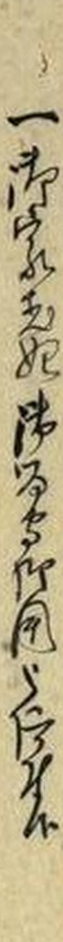一御家老始御留守御用被仰付候
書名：少傅日録抄（斉承付側向頭取日記、在府）
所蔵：福井県文書館 Fukui Prefectural Archives
